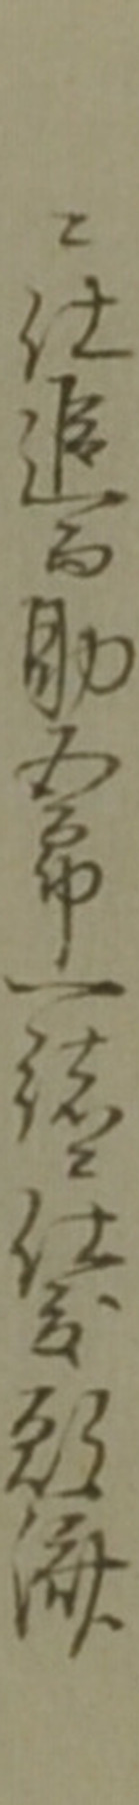ニ仕追而助五郎一緒ニ仕度願済
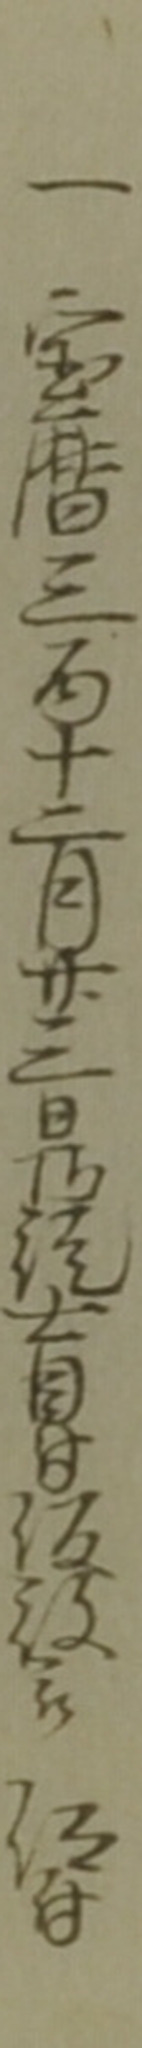一宝暦三丙十二月廿三日御徒士目付仮役被仰付
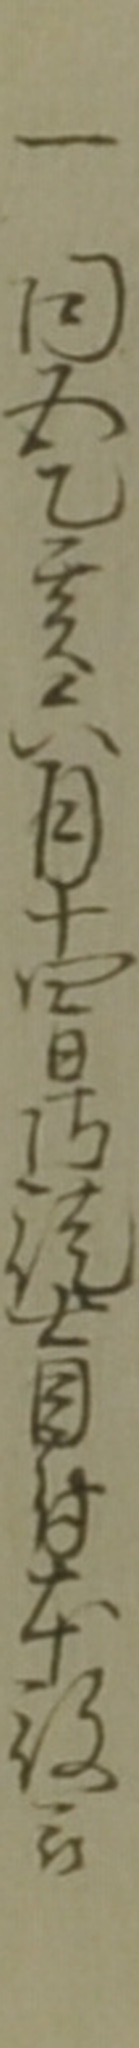一同五乙亥六月十四日御徒士目付本役被
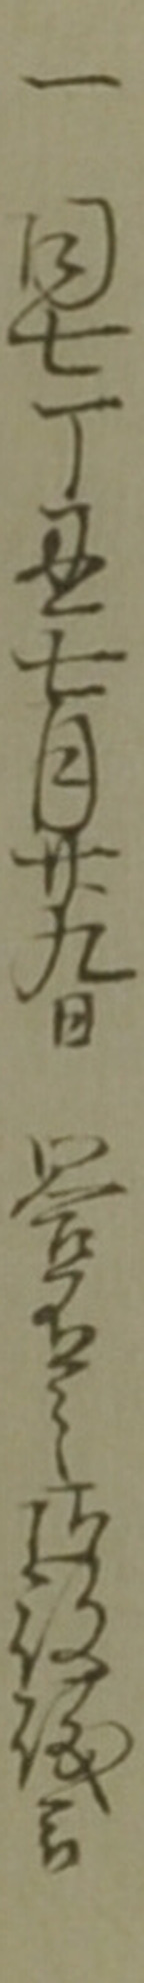一同七丁丑七月廿九日思召有之御役儀被
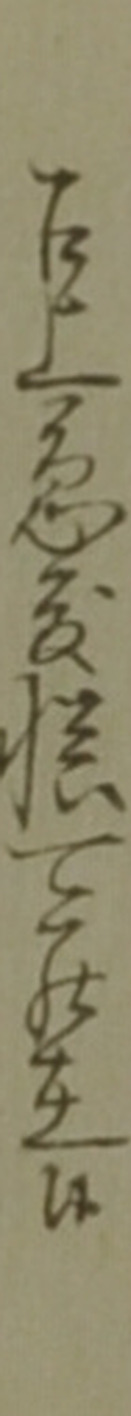召上急度慎可罷在候
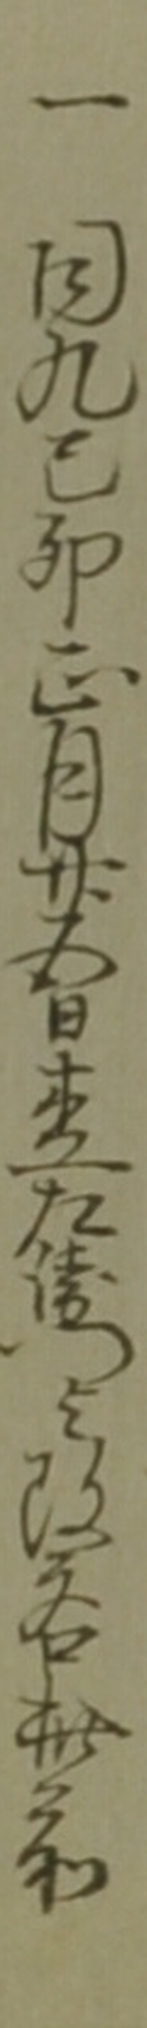一同九己卯正月廿五日杢左衛門与改名此前
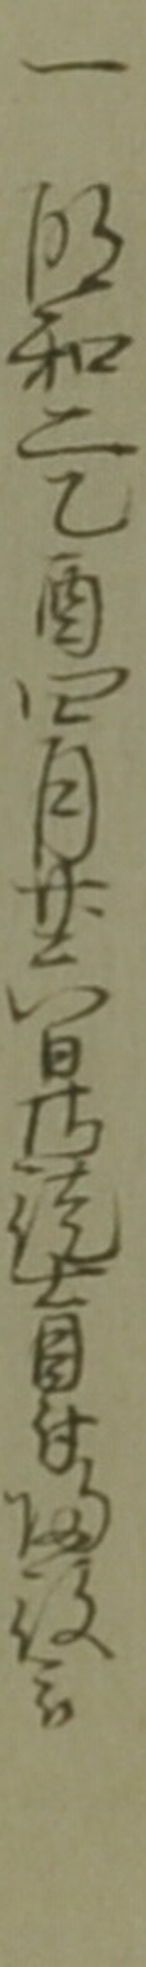一明和二乙酉四月廿六日御徒士目付帰役被
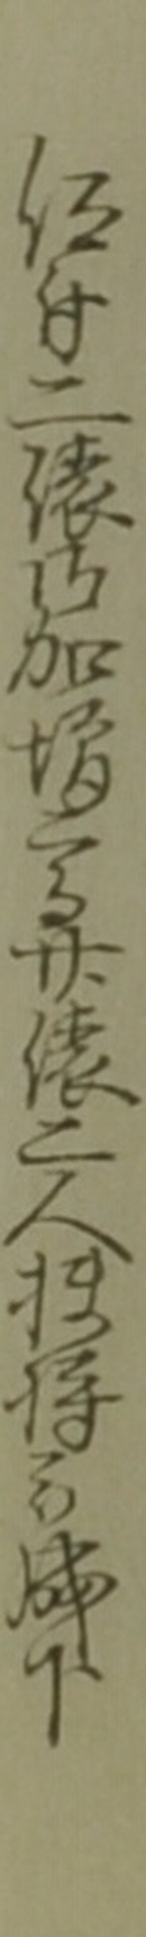仰付二俵御加増高廿俵二人扶持被成下
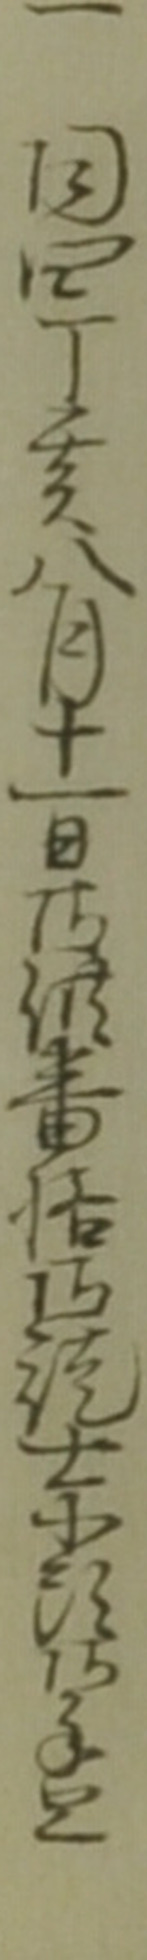一同四丁亥八月十一日御供番格御徒士小頭御手廻
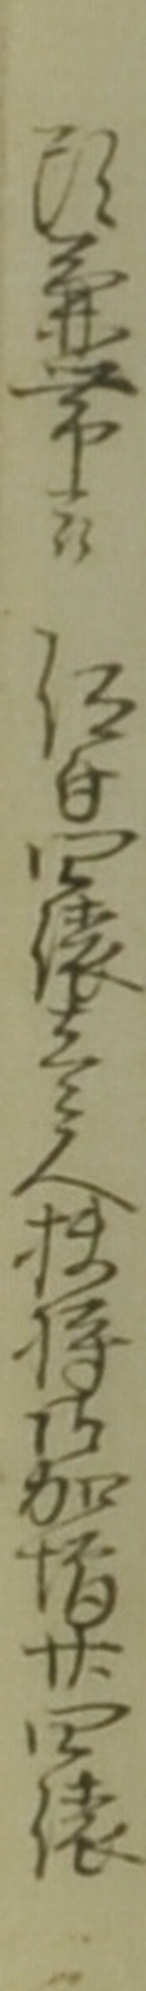頭兼帯被仰付四俵壱人扶持御加増廿四俵

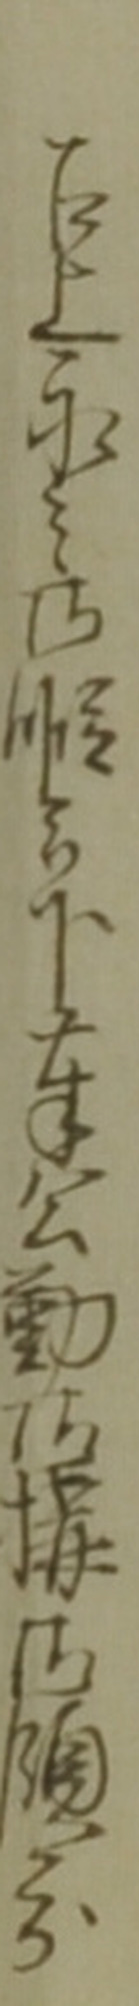召上永之御暇被下奉公勤御構御領分
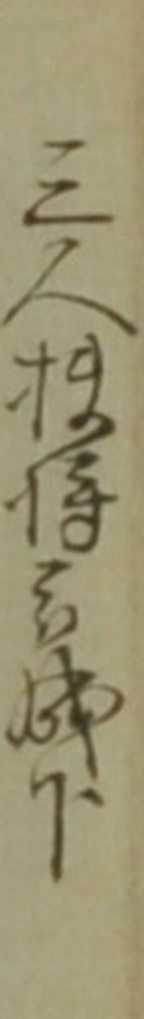三人扶持被成下
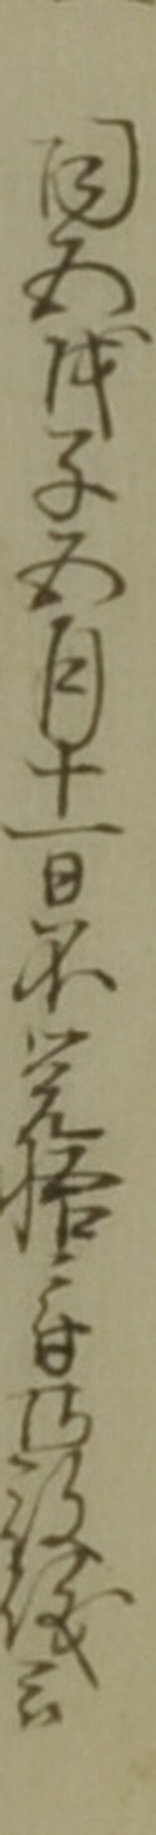一同五戌子五月十一日不覚悟ニ付御役儀被
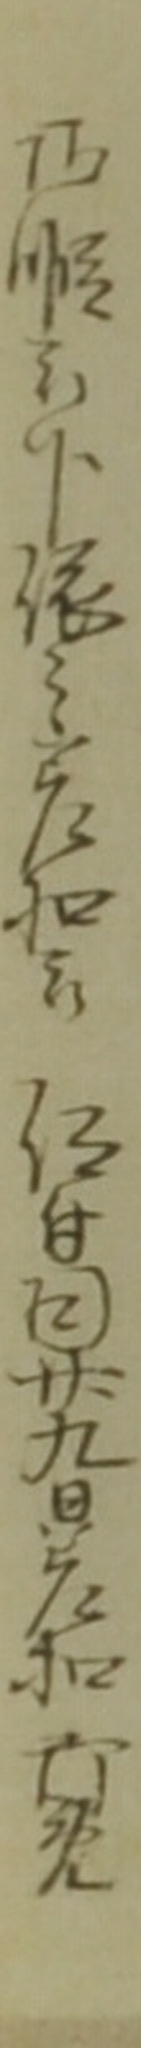御暇被下依之差控被仰付同廿九日差控御免

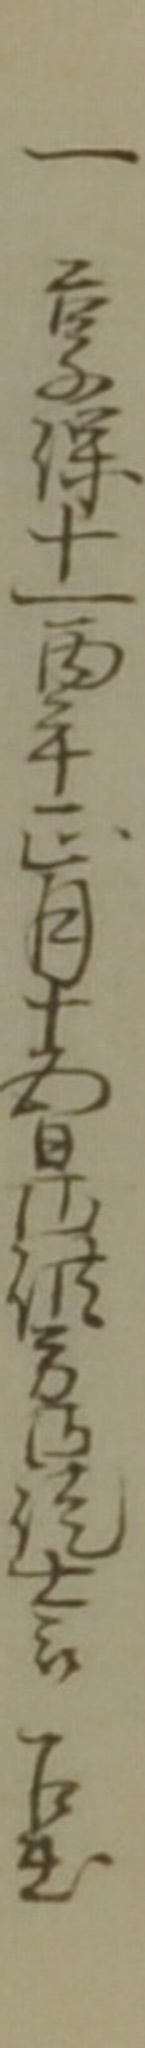一享保十一丙午正月十五日御供方御徒士被召出
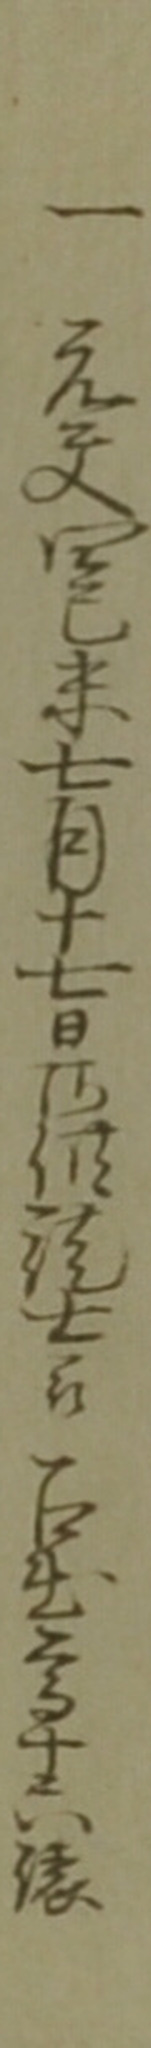一元文四己未七月十七日御供徒士被召出高十六俵
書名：無足廃家（壱）
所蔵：伊那市立高遠町図書館・合同会社AMANE
